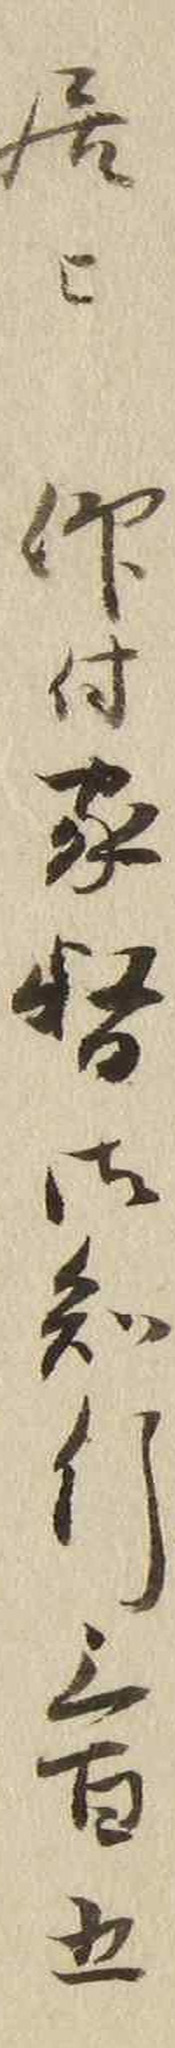居被仰付家督御知行三百五
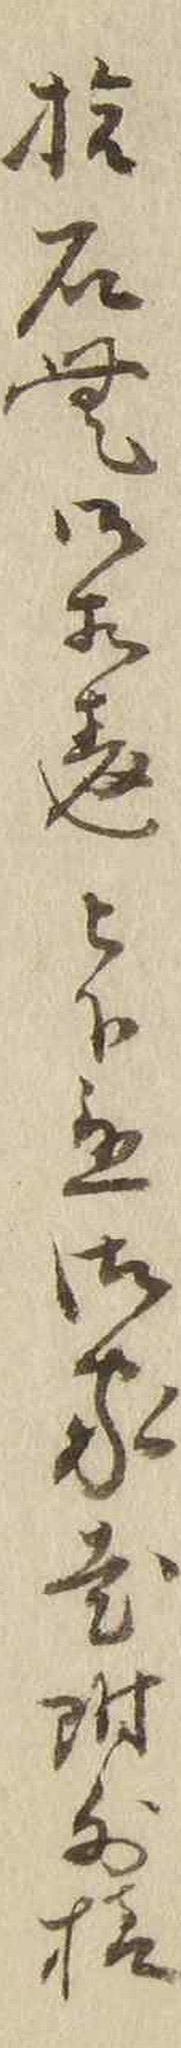拾石無御相違被下置御家老附外様

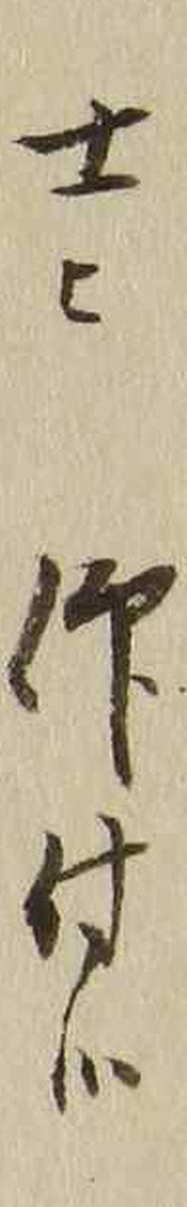士被仰付候
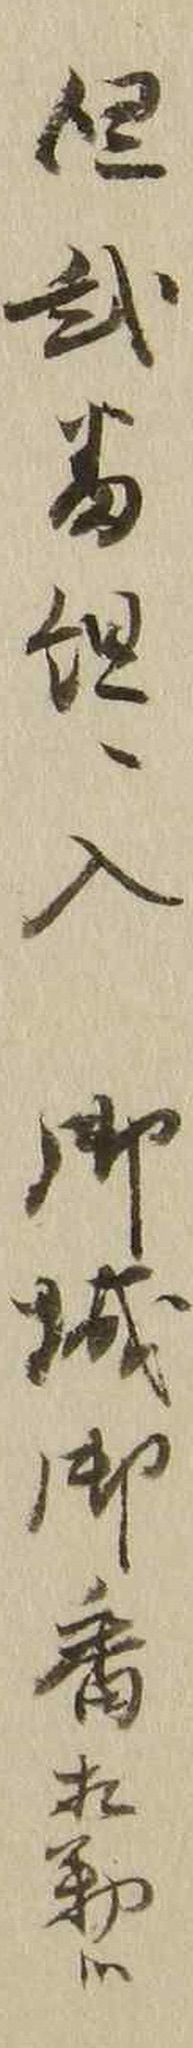但弐番組へ入御城御番相勤候
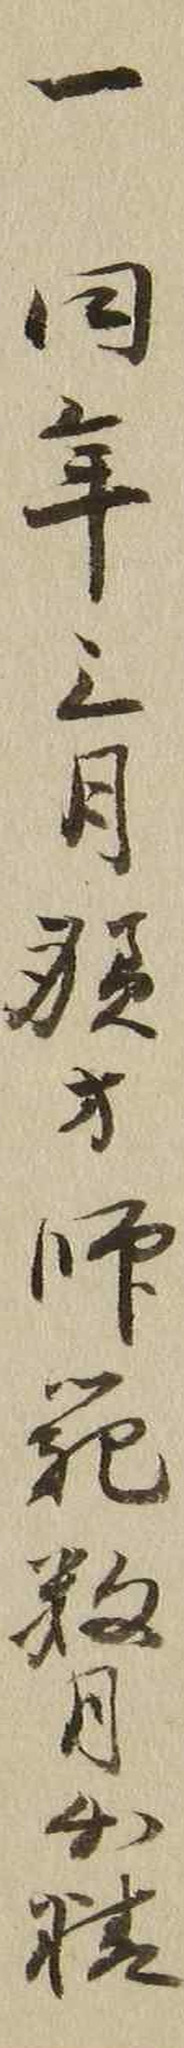一同年三月躾方師範数月出精
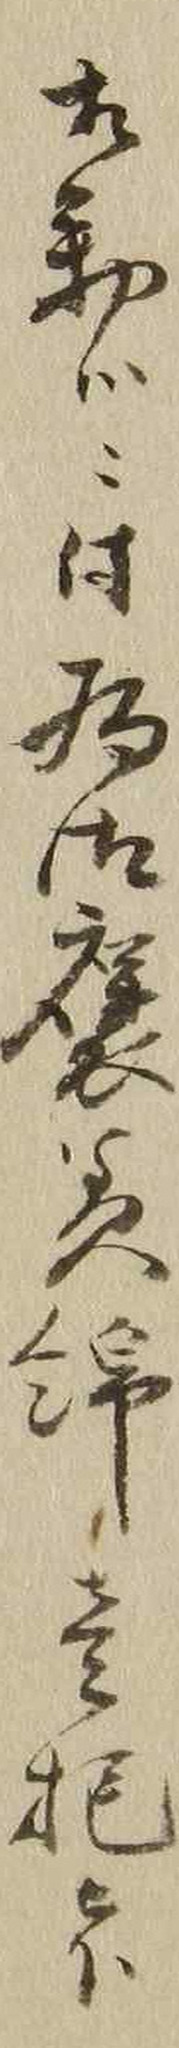相勤候ニ付為御褒美綿壱把被下
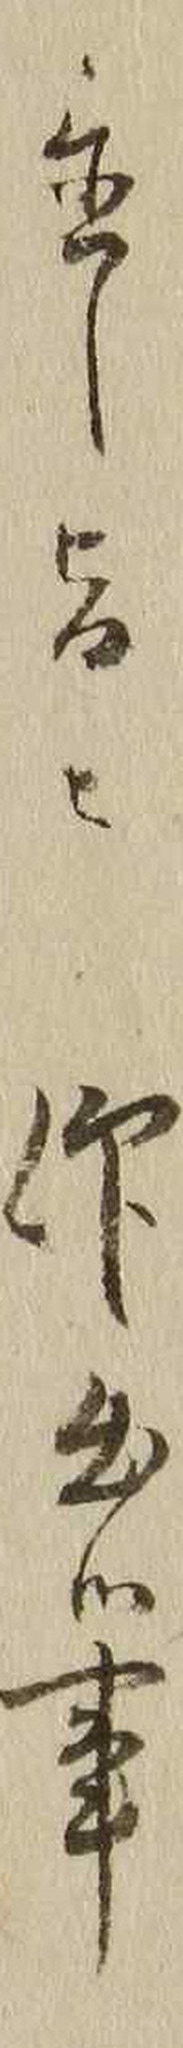置之旨被仰出候事
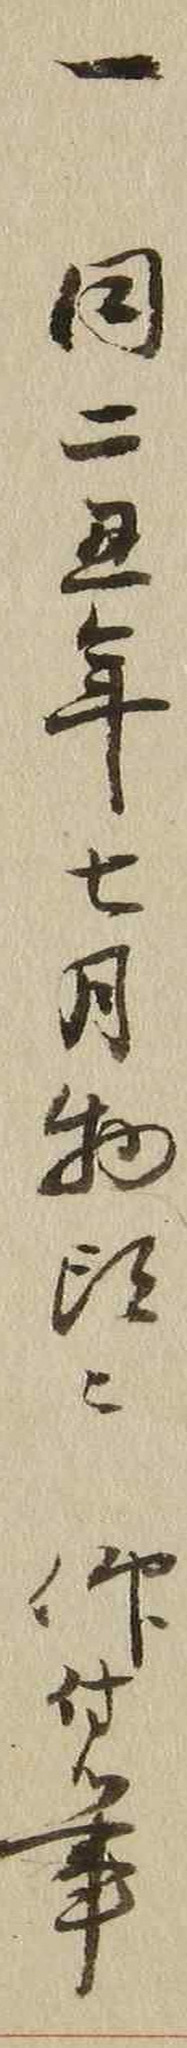一同二丑年七月物頭被仰付候事
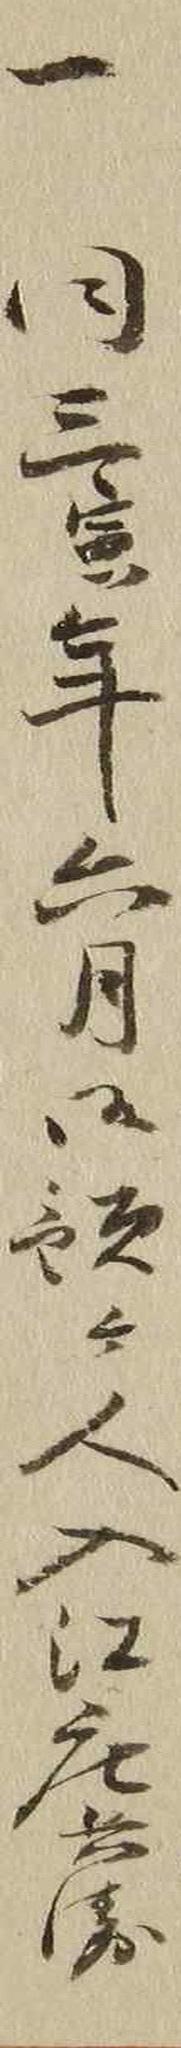一同三寅年六月御預ヶ人入江庄兵衛
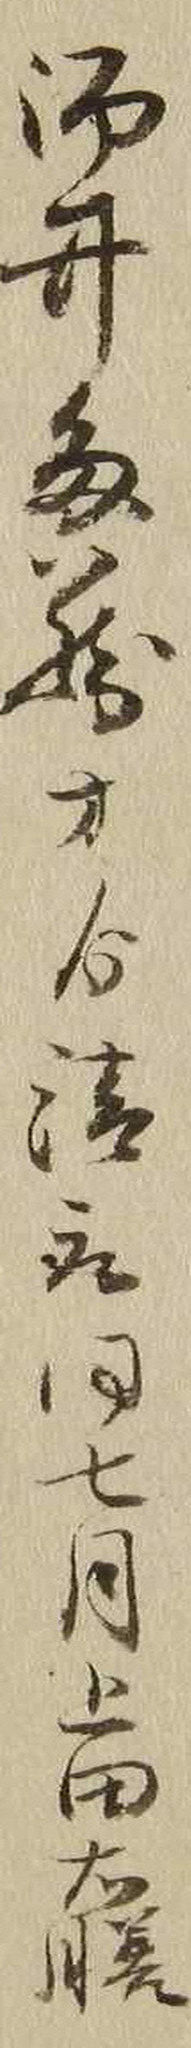酒井多蔵方ゟ請取同七月上田右膳
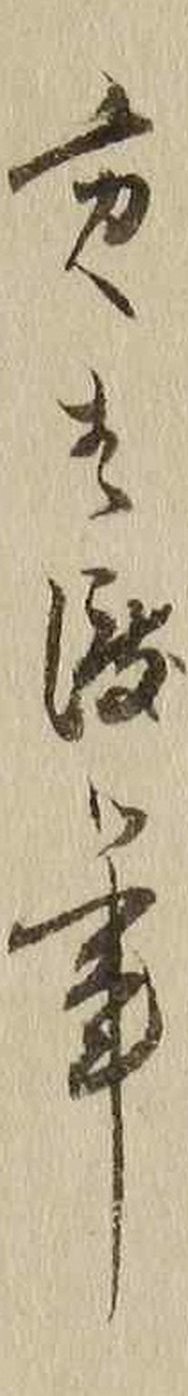方へ相渡候事
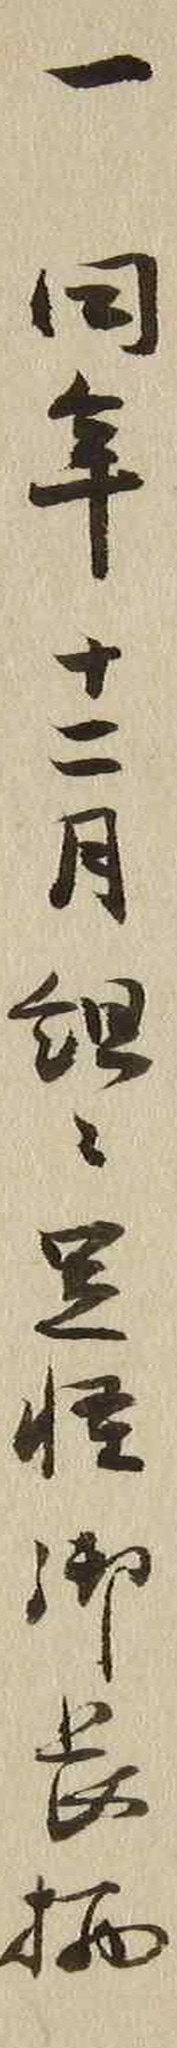一同年十二月組々足軽御長柄
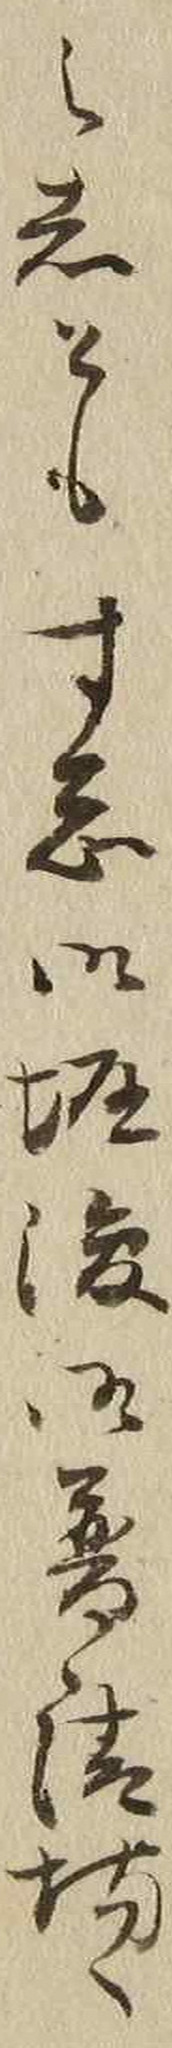之者とも寸志御堀浚御普請場へ
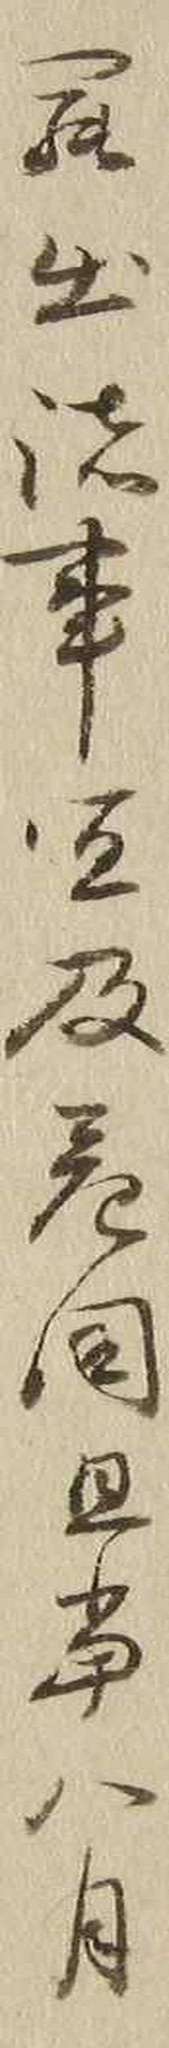罷出諸事宜及差図且当八月
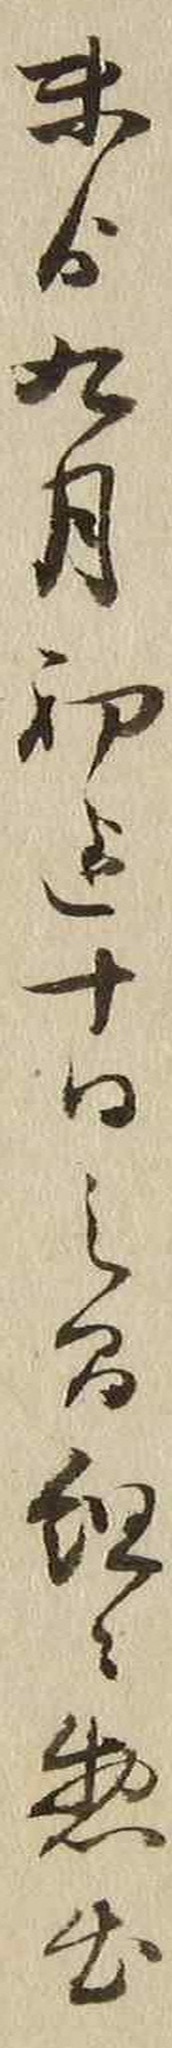末ゟ九月初迄十日之間組々惣出
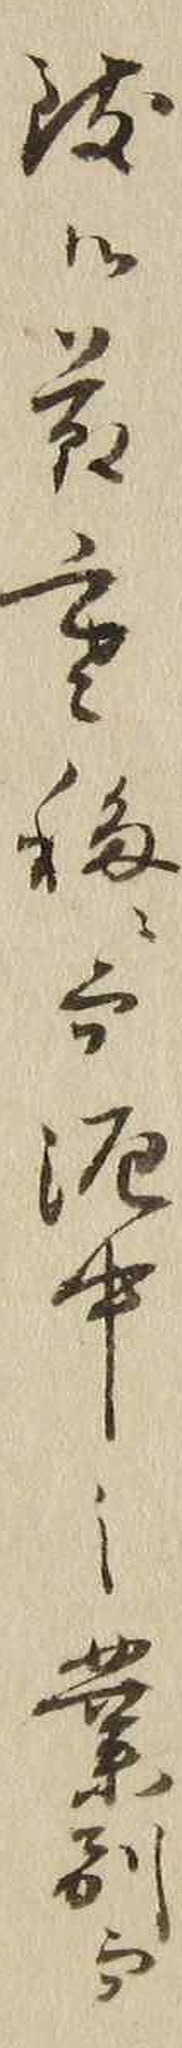致候節寒移ニ而泥中之業別而
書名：諸士系譜　巻之225　ま之部6
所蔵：会津若松市立会津図書館
